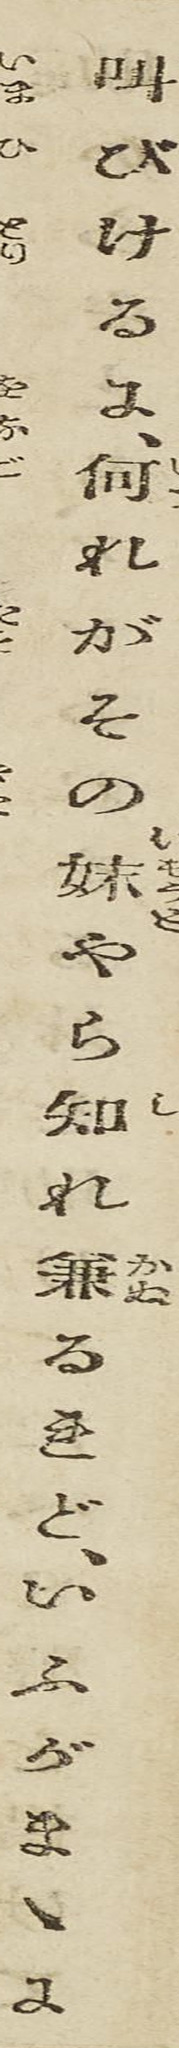叫びけるに、何れがその妹やら知れ兼るれど、いふがまゝに
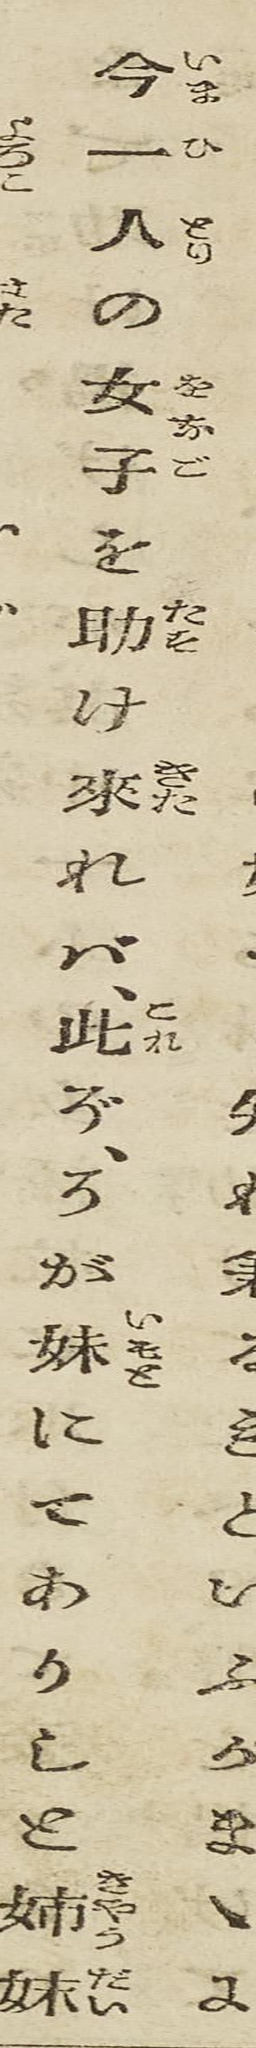今一人の女子を助け来れば、此ぞ、そが妹にてありしと姉妹
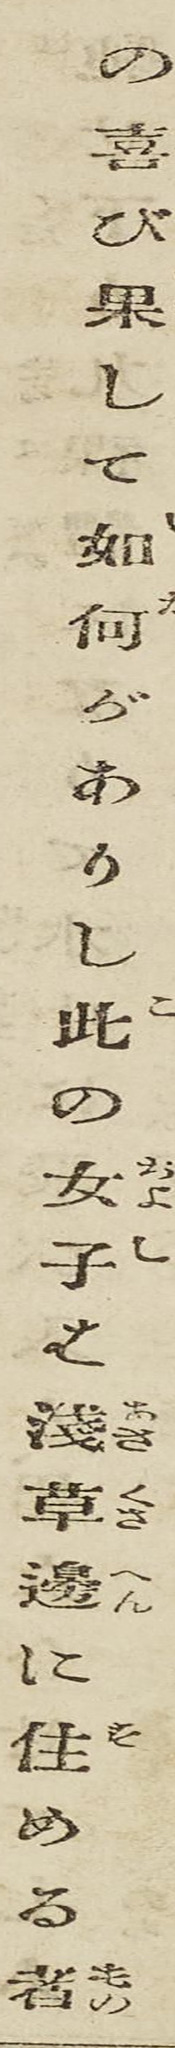の喜び果して如何がありし此の女子は浅草辺に住める者
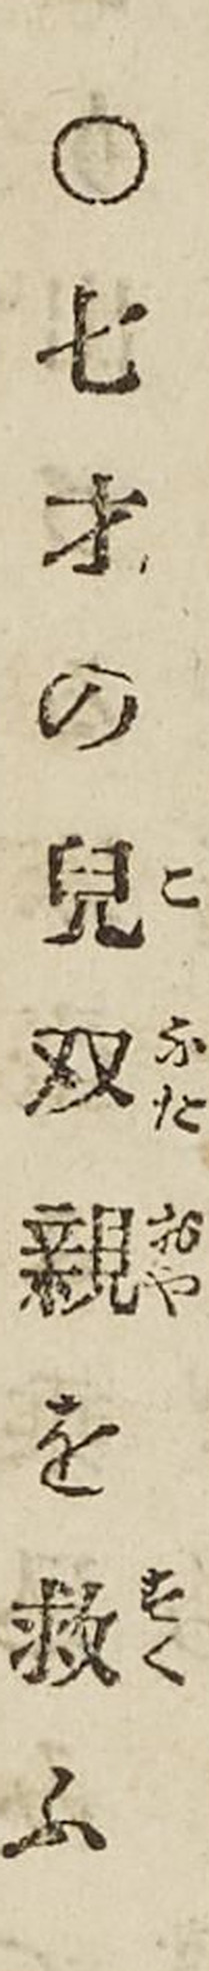○七才の児双親を救ふ
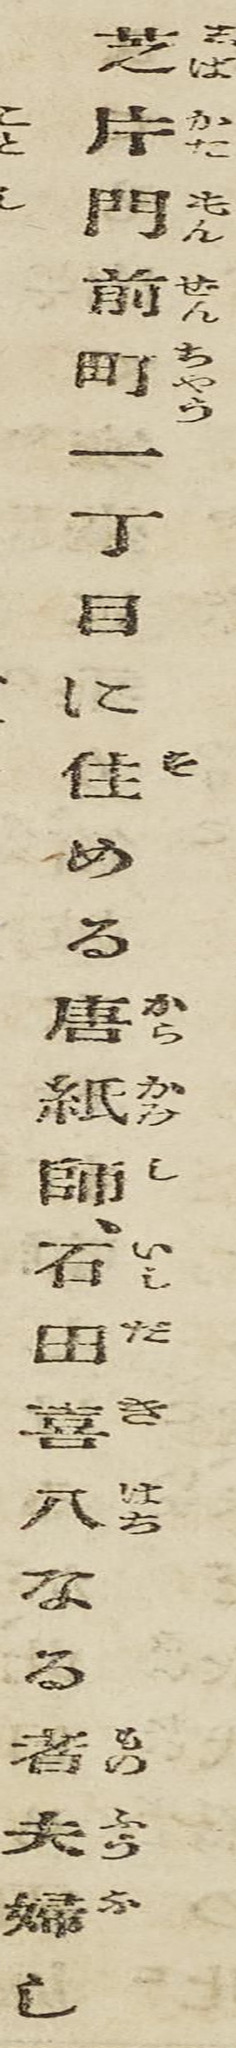芝片門前町一丁目に住める唐紙師、石田喜八なる者夫婦し
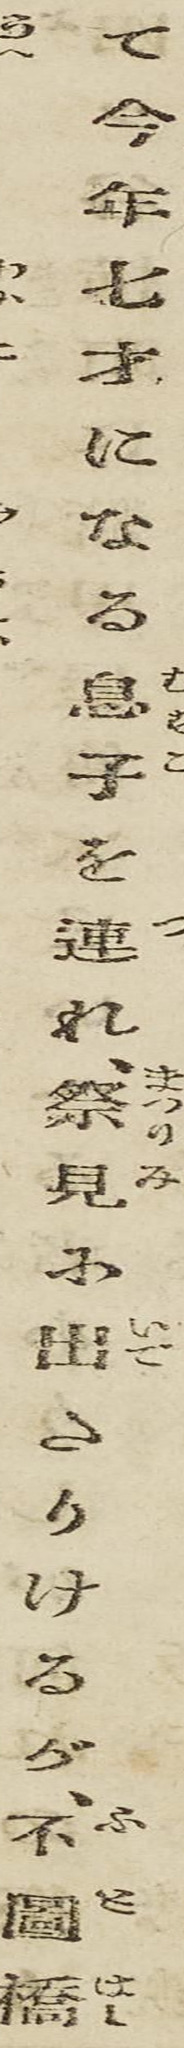て今年七才になる息子を連れ、祭見に出たりけるが、不図橋
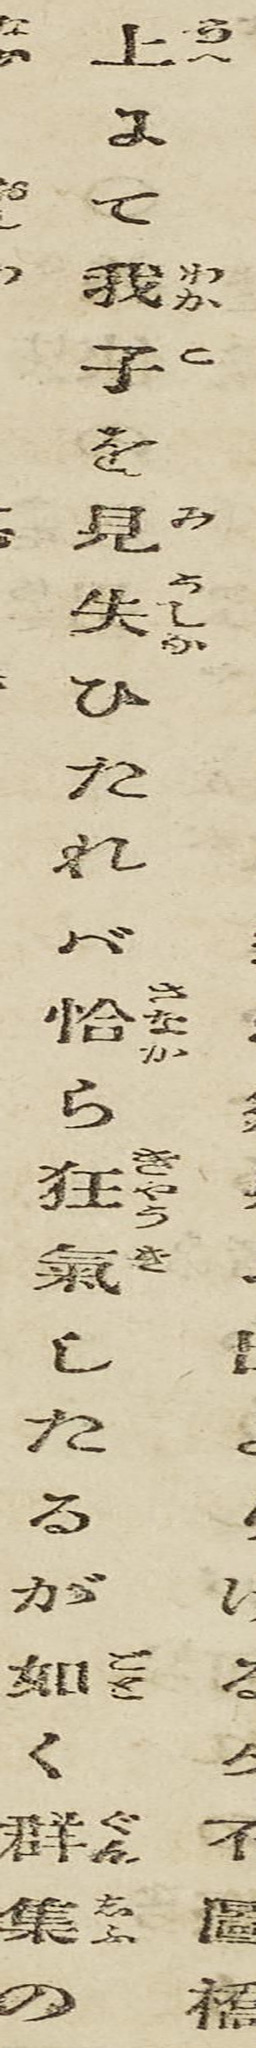上にて我子を見失ひたれば恰ら狂気したるが如く群集の
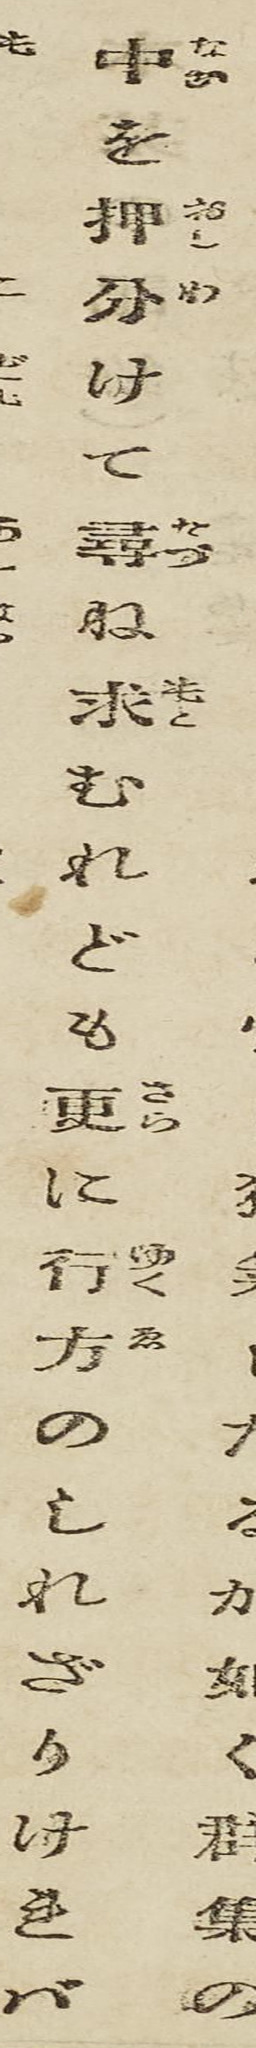中を押分けて尋ね求むれども更に行方のしれざりければ
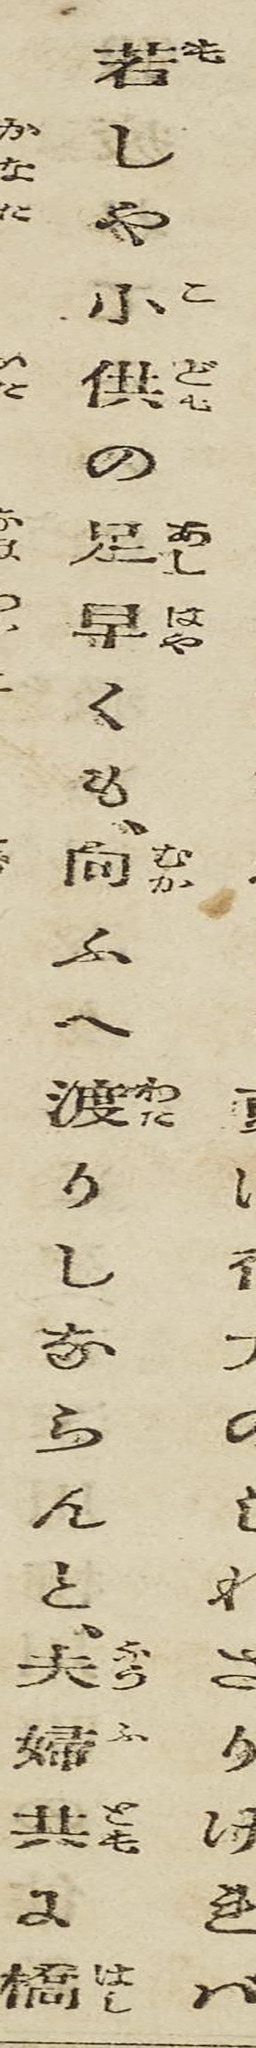若しや子供の足早くも、向ふへ渡りしならんと、夫婦共に橋
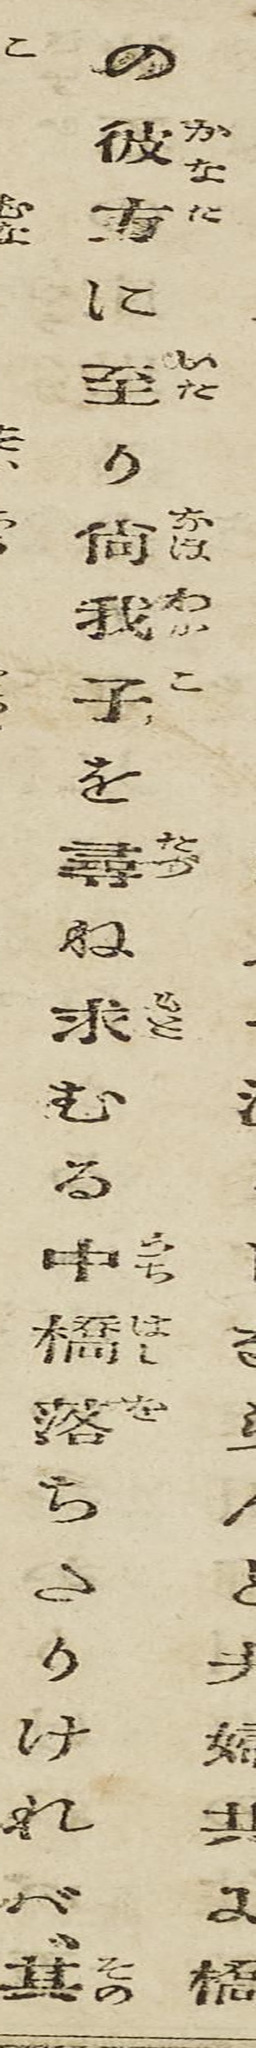の彼方に至り尚我子を尋ね求むる中橋落ちたりければ、其
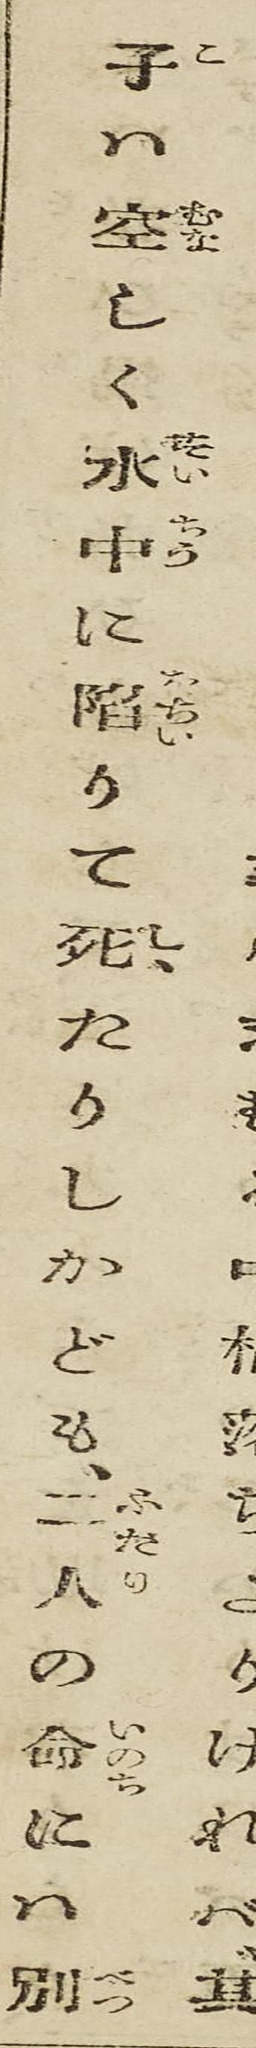子は空しく水中に陥りて死たりしかども、二人の命には別
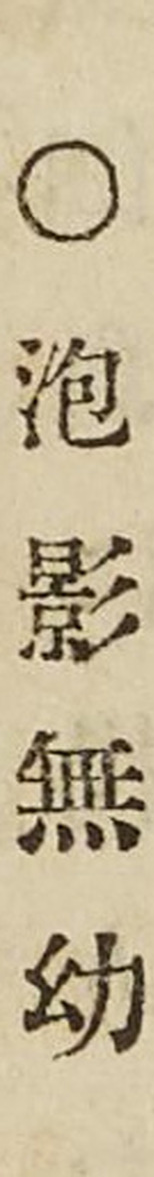○泡影無幼
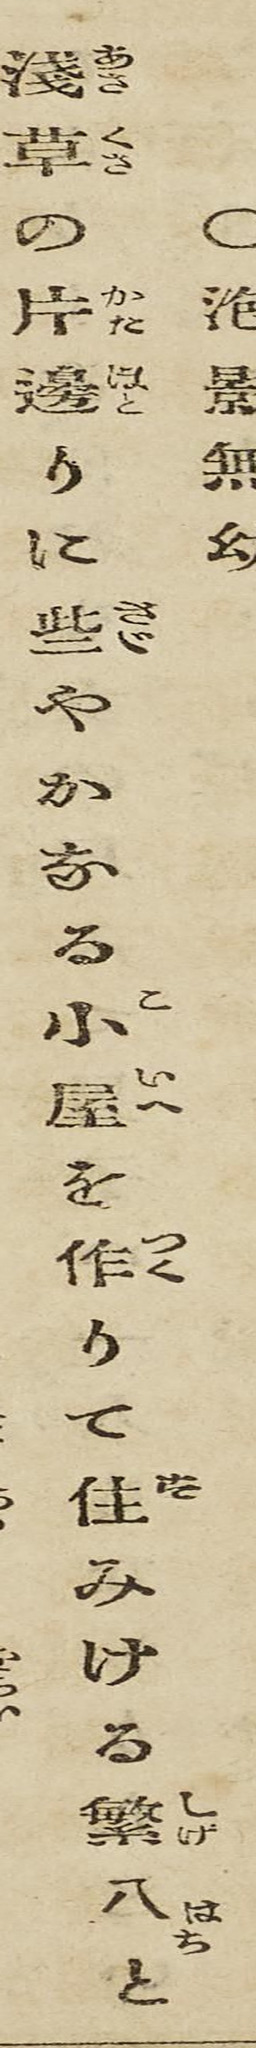浅草の片辺りに些やかなる小屋を作りて住みける繁八と
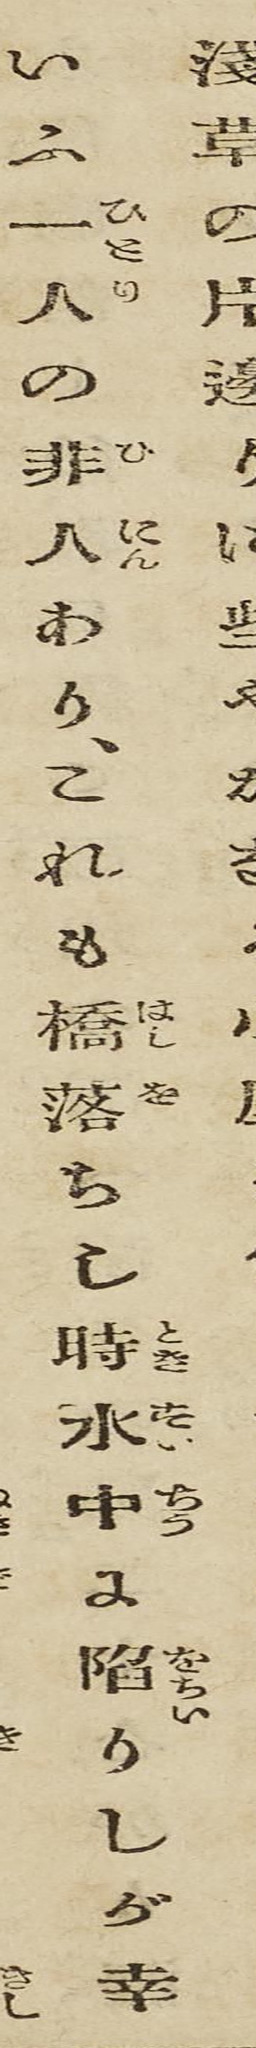いふ一人の非人あり、これも橋落し時水中に陥りしが幸
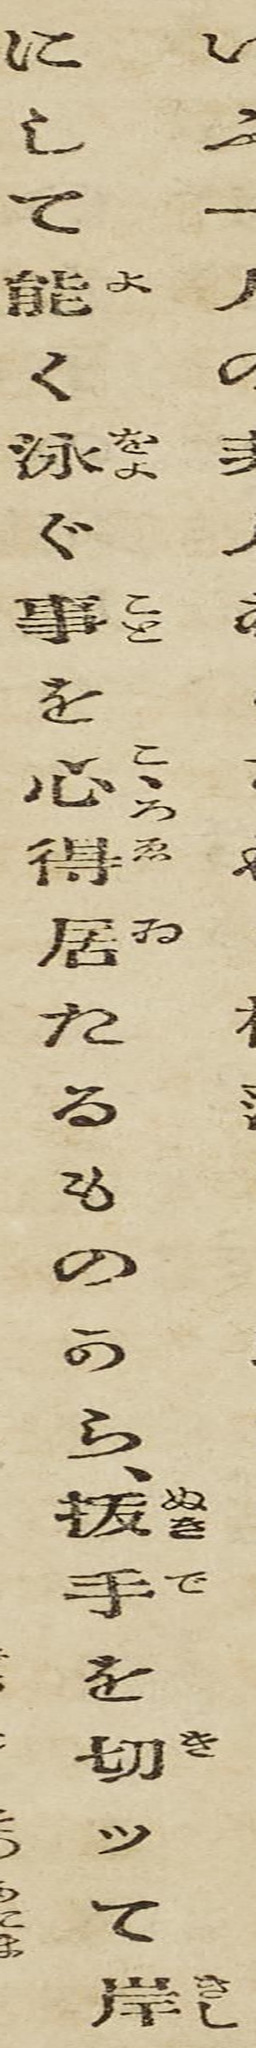にして能く泳ぐ事を心得居たるものから、抜手を切ツて岸
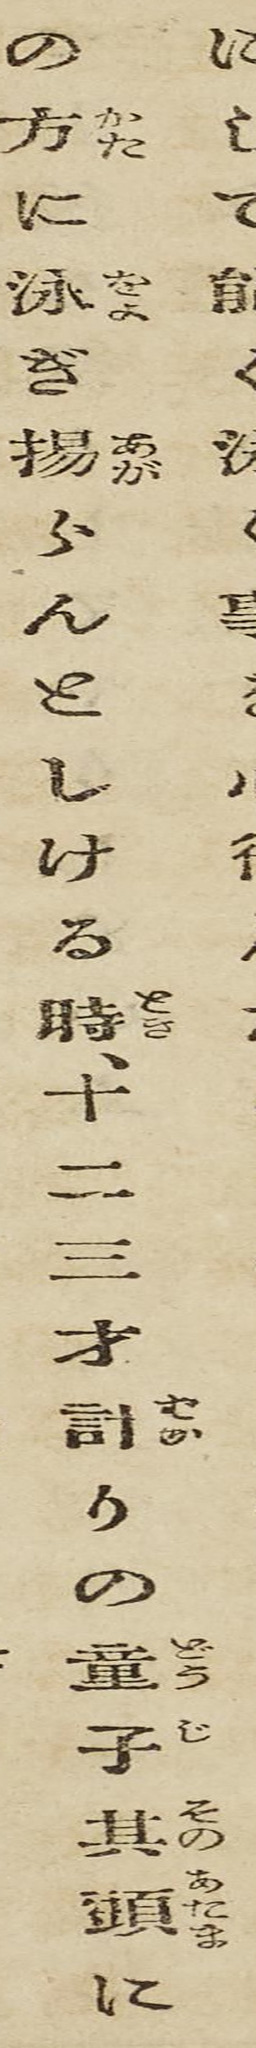の方に泳ぎ揚らんとしける時、十二三才計りの童子其頭に
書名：永代惨話　文化の夢　全
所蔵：東京大学地震研究所図書室 Earthquake Research Institute Library, The University of Tokyo, JAPAN
